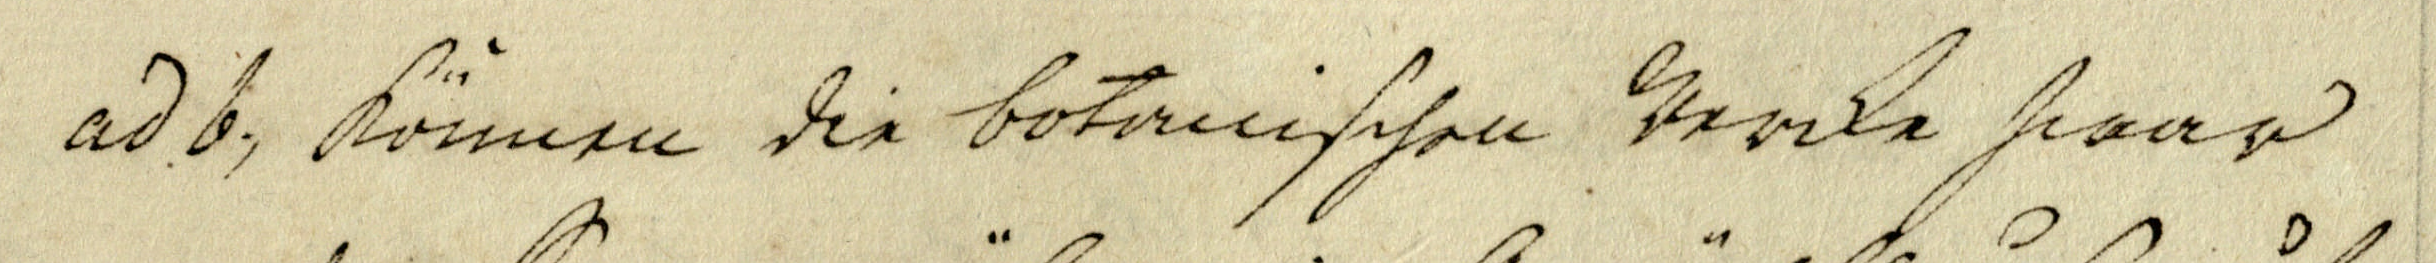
ad b., können die botanischen Wercke zwar
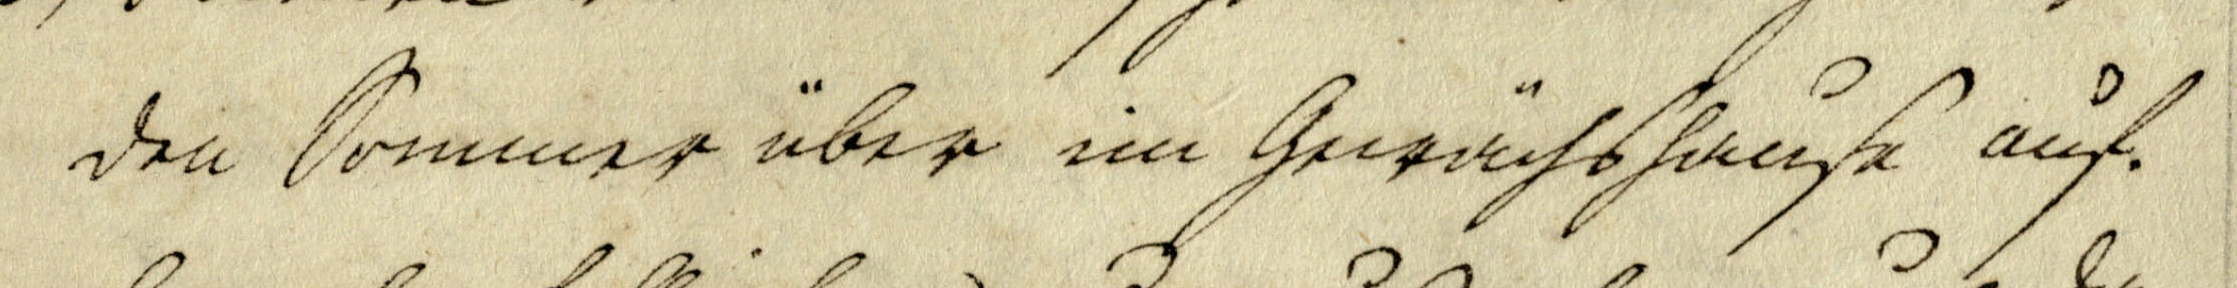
den Sommer über im Gewächshause auf¬
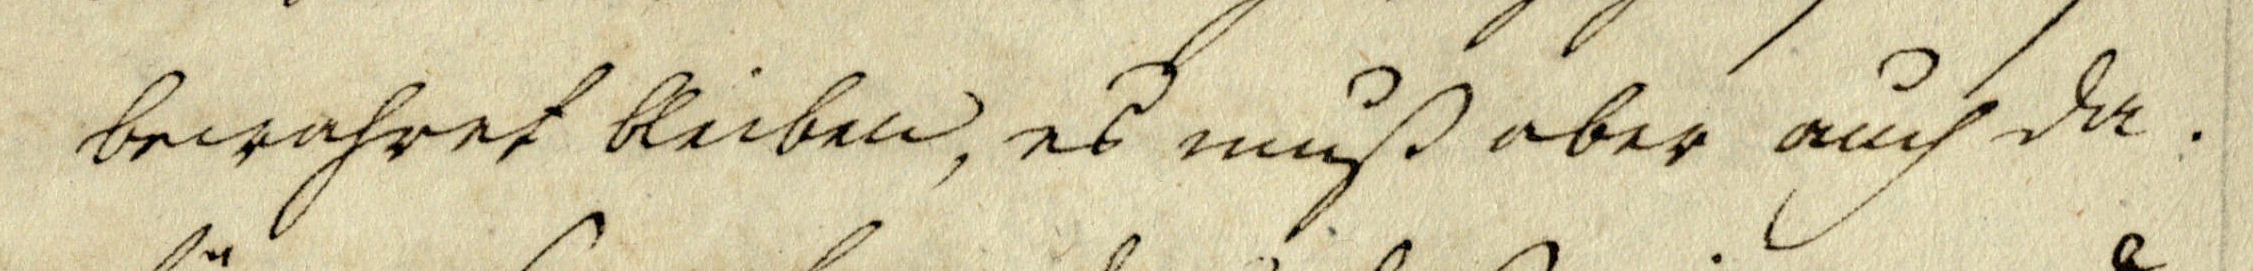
bewahret bleiben, es muß aber auch da¬
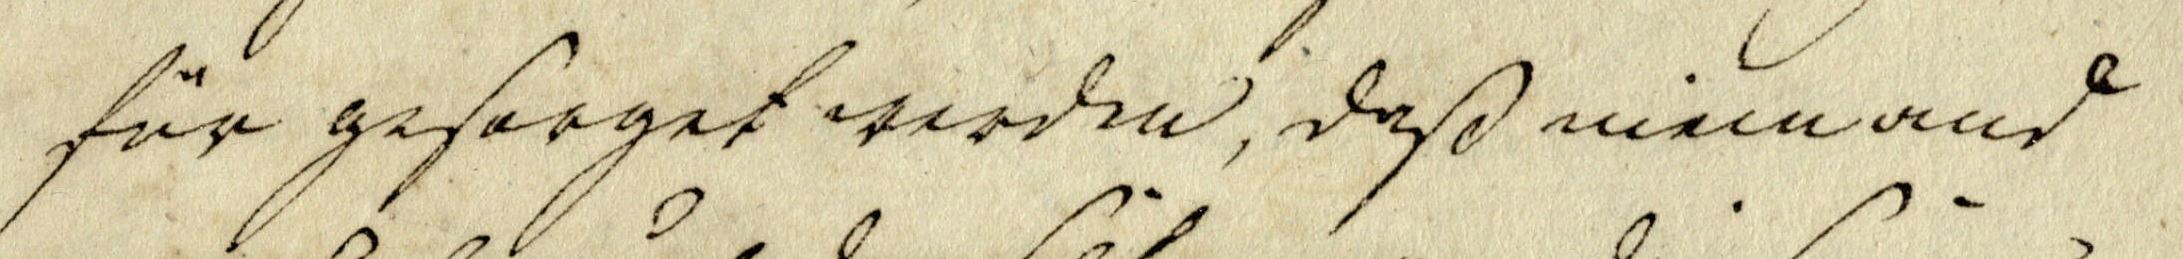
für gesorget werden, daß niemand
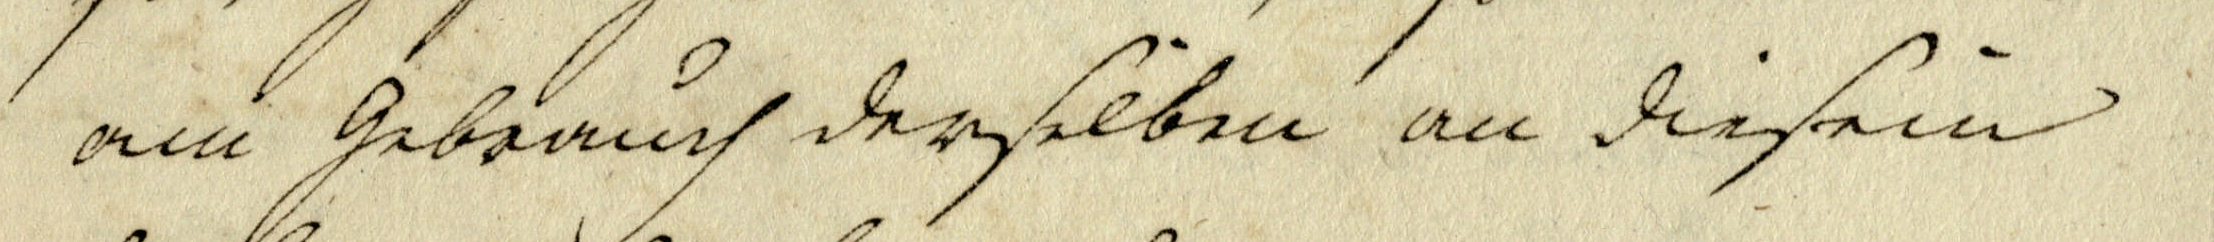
am Gebrauch derselben an diesem
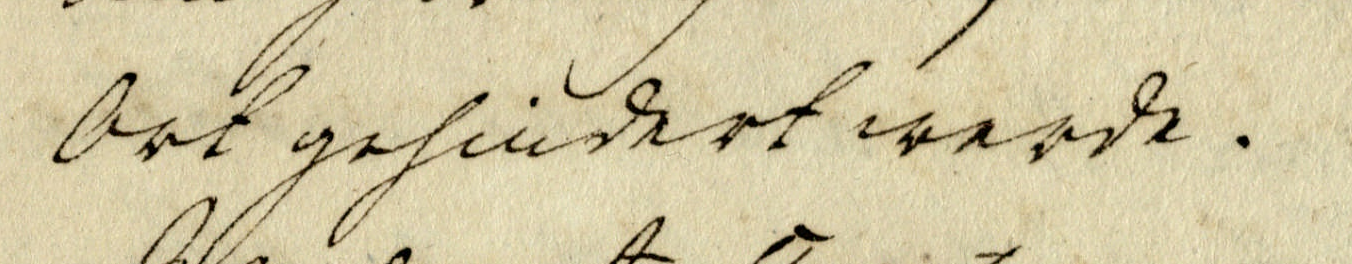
Ort gehindert werde.
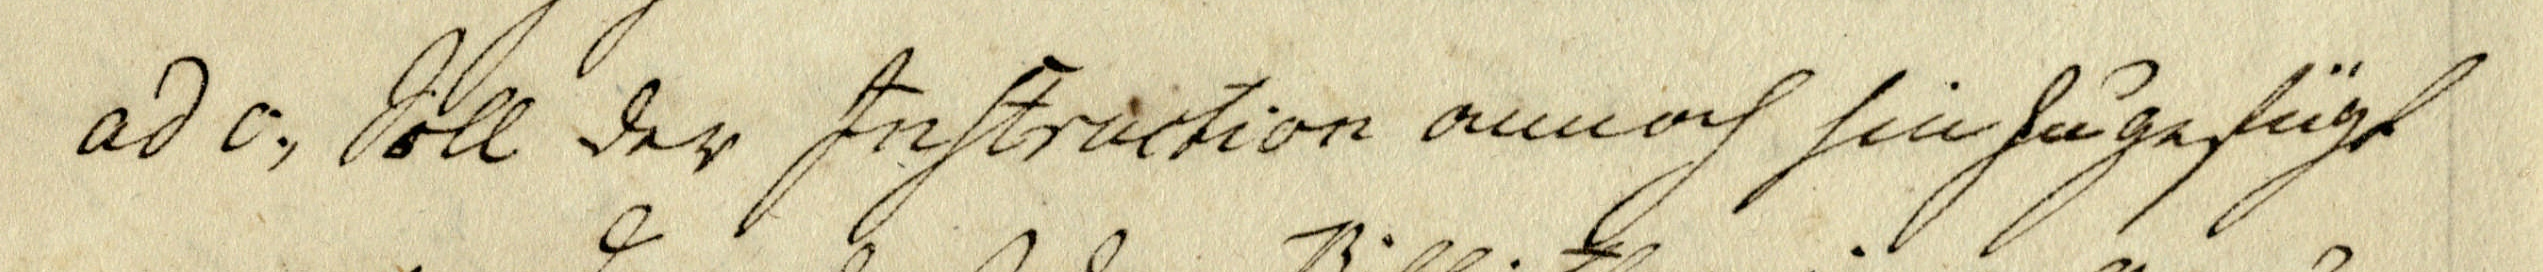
ad c., Soll der Instruction annoch hinzugefügt
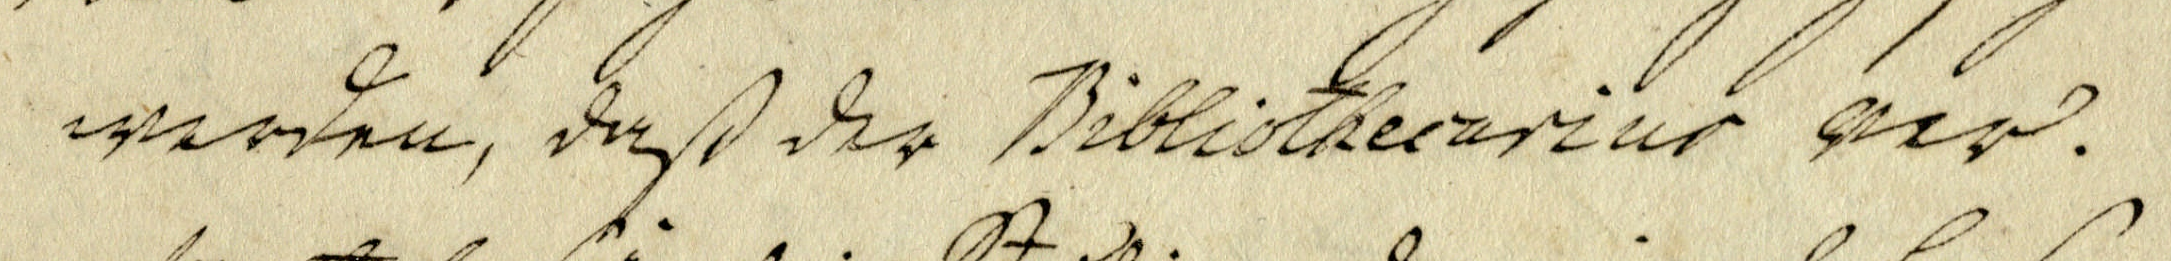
werden, daß der Bibliothecarius ver¬
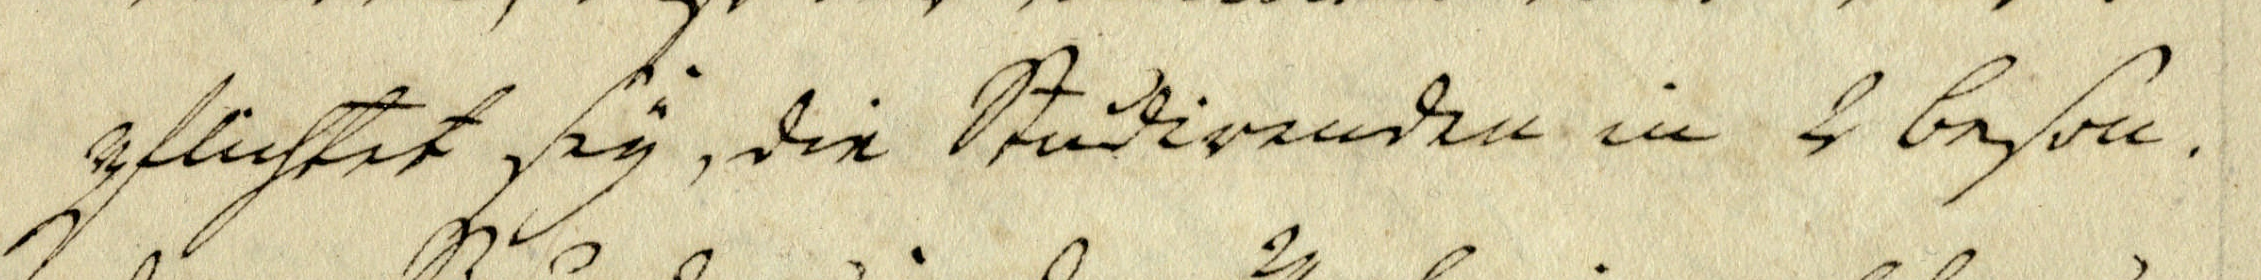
pflichtet seÿ, die Studirenden in 2 beson¬.
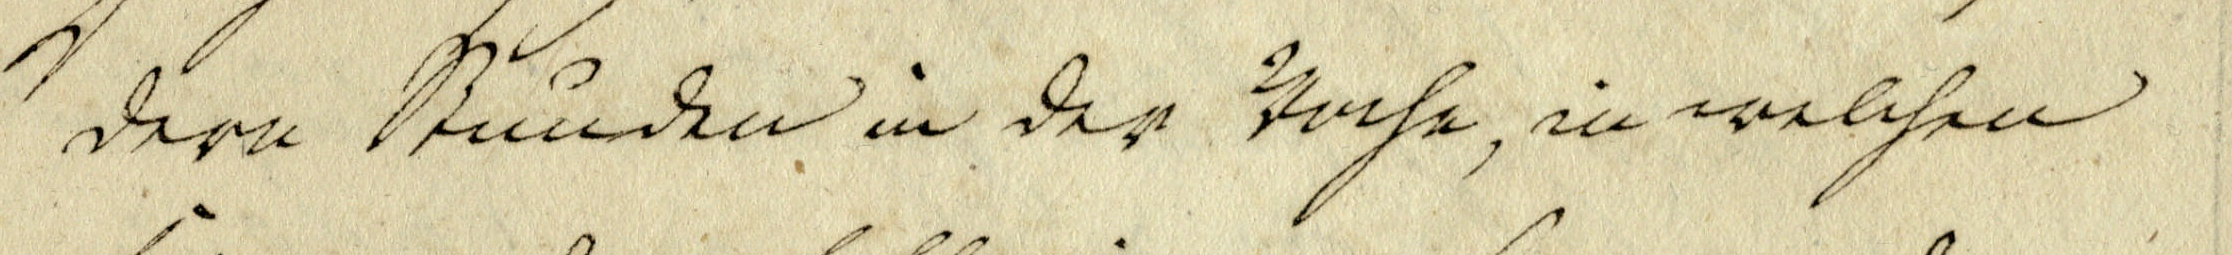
dern Stunden in der Woche, in welchen
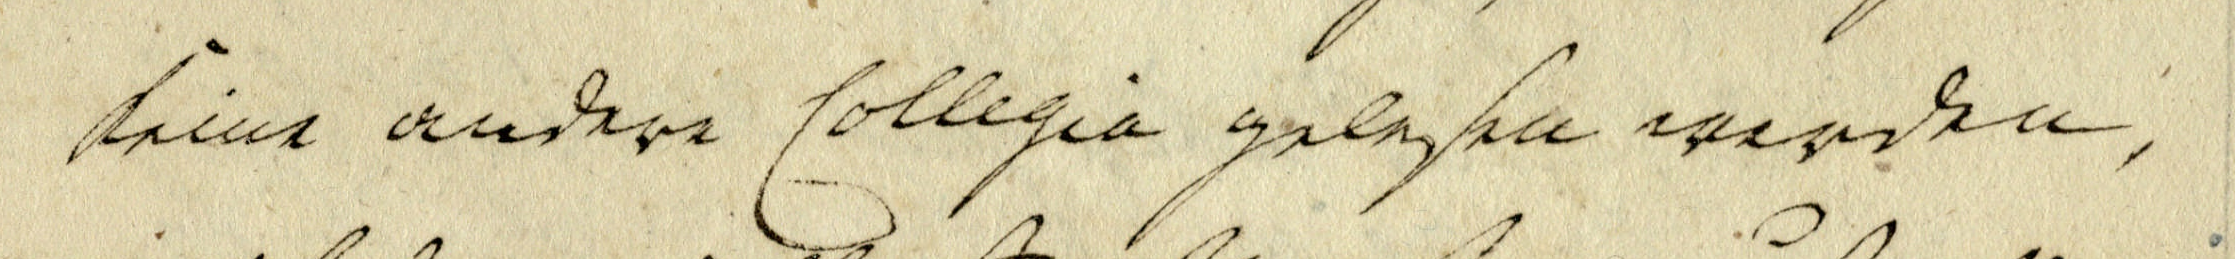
keine andere Collegia gelesen werden,
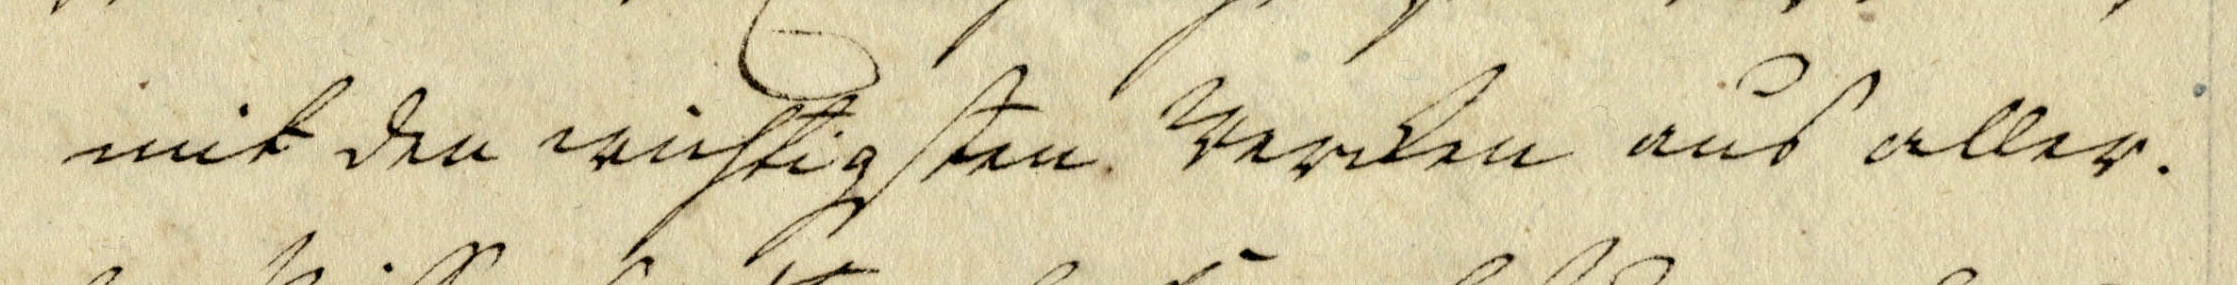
mit den wichtigsten Wercken aus aller¬
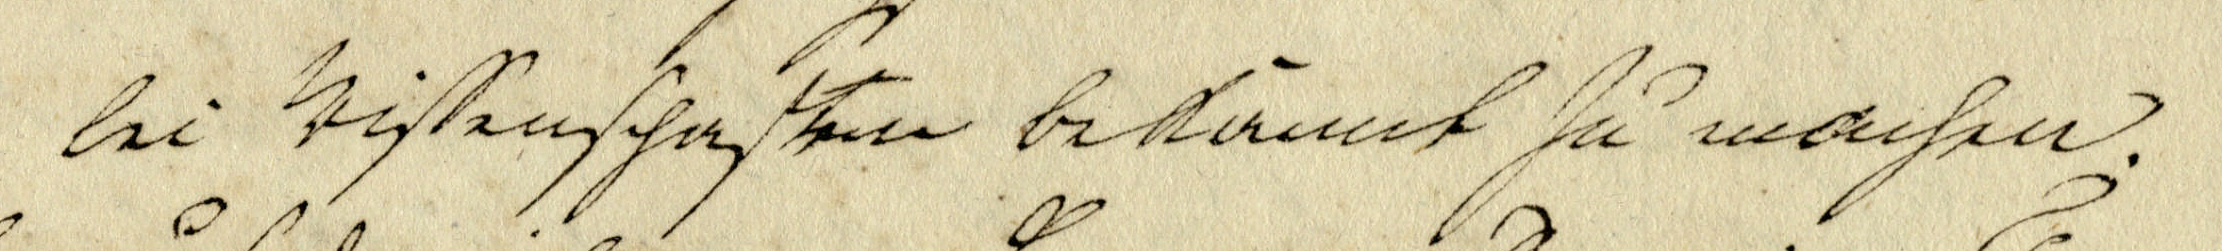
lei Wissenschaften bekannt zu machen.
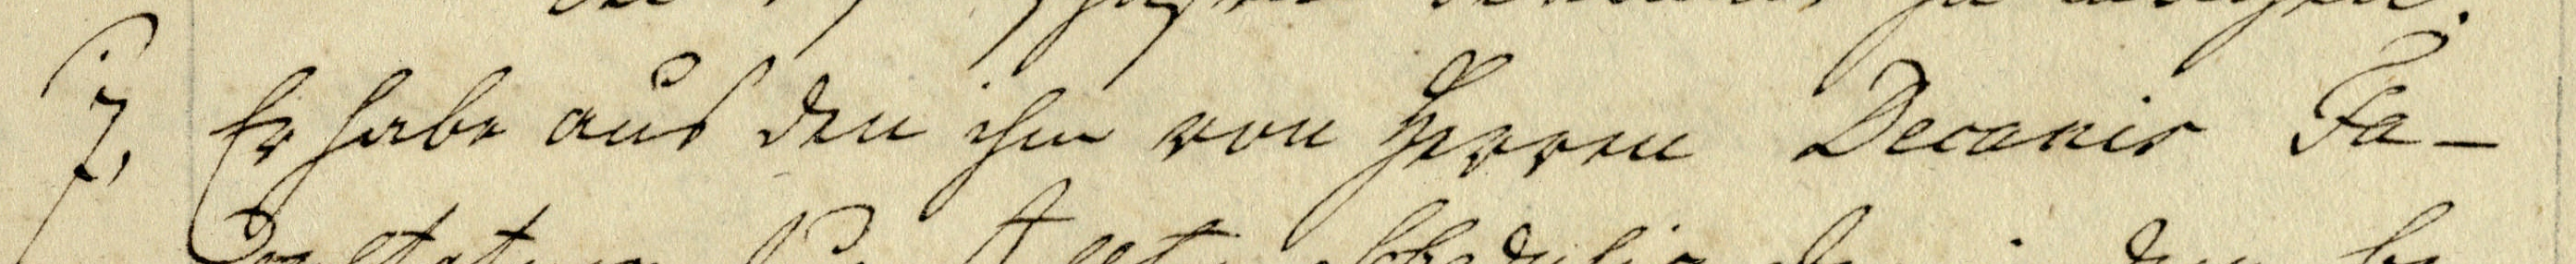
7., Er habe aus den ihm von Herren Decanis Fa¬
